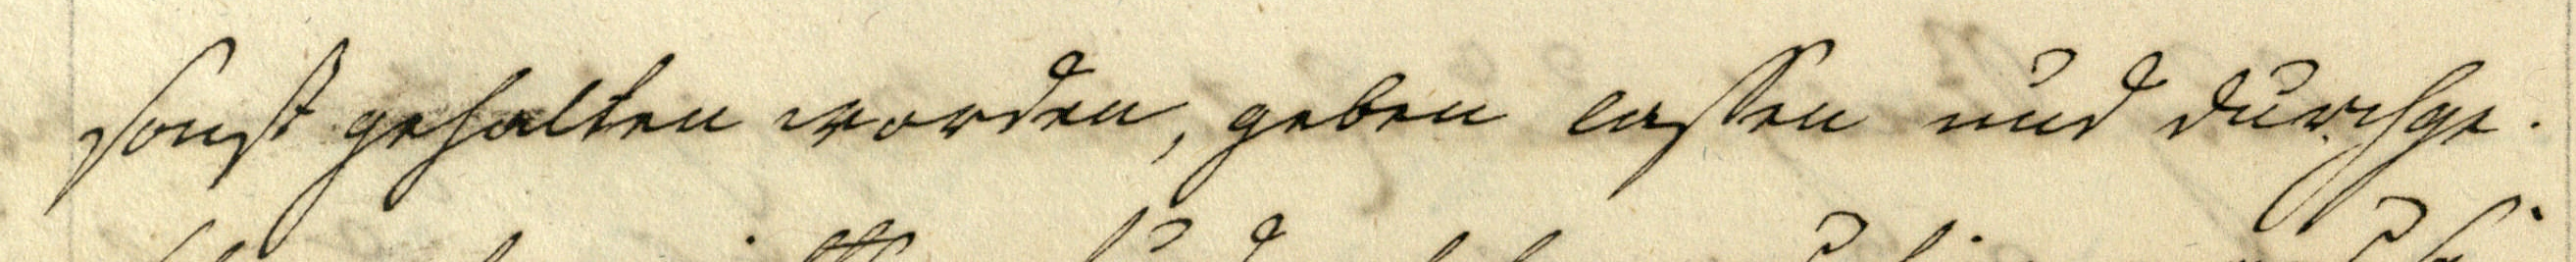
sonst gehalten worden, geben lassen und durchge-
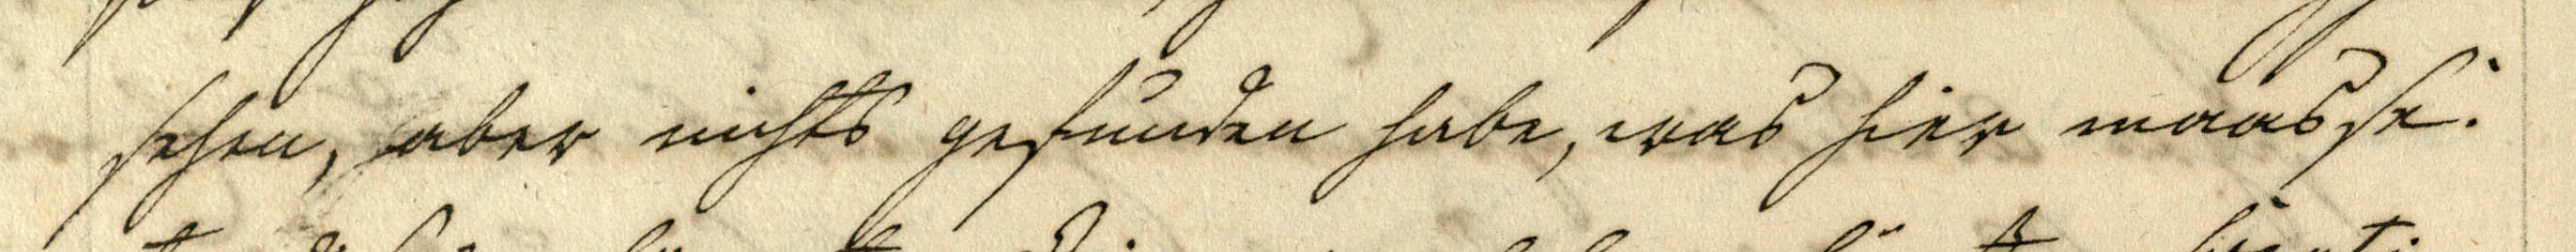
sehen, aber nichts gefunden habe, was hier maasse-
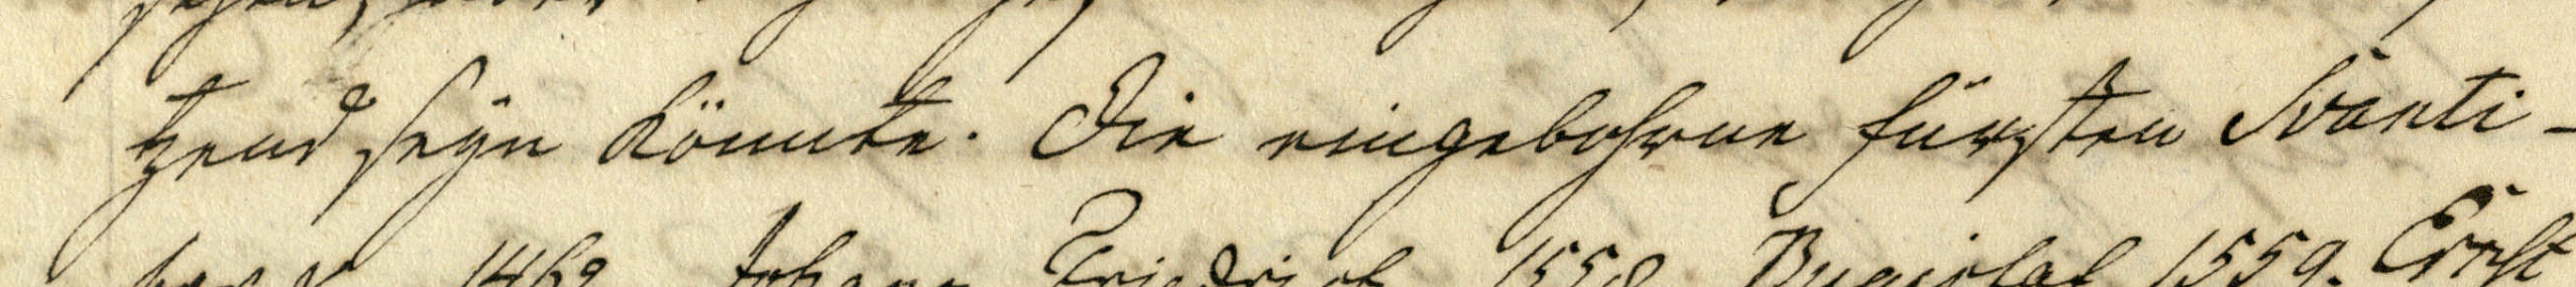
tzend seyn könnte. Die eingebohrne Fürsten Svanti-
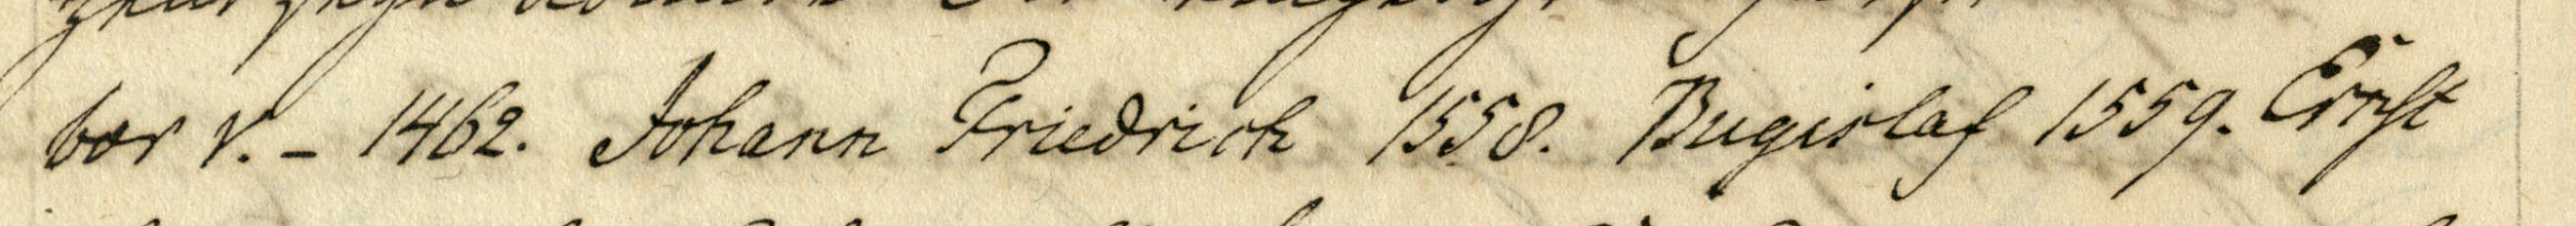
bor V. - 1462. Johann Friedrich 1558. Bugislaf 1559. Ernst
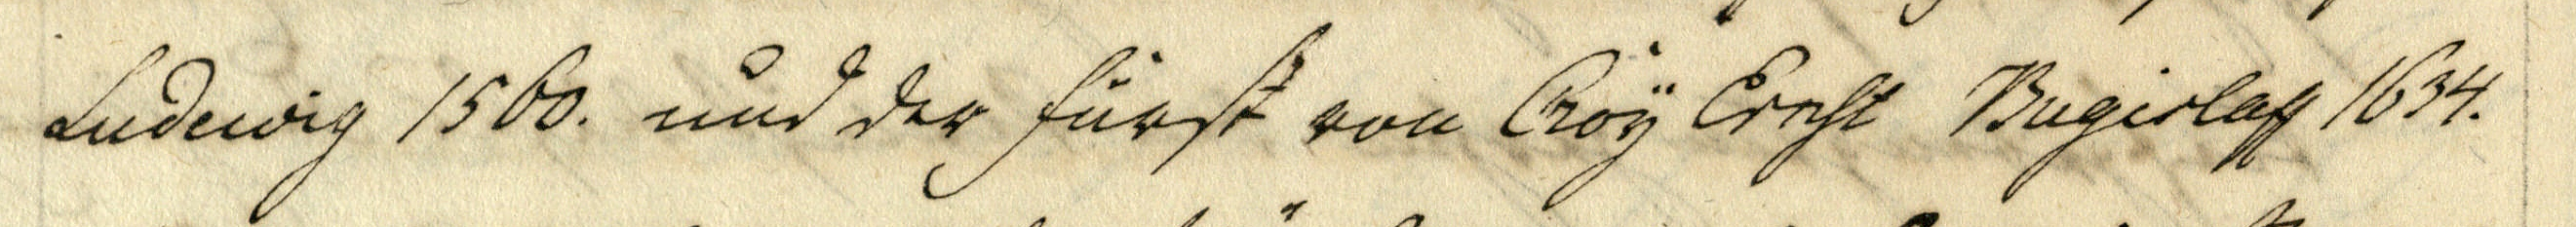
Ludewig 1560. und der Fürst von Croy Ernst Bugislaff 1634.
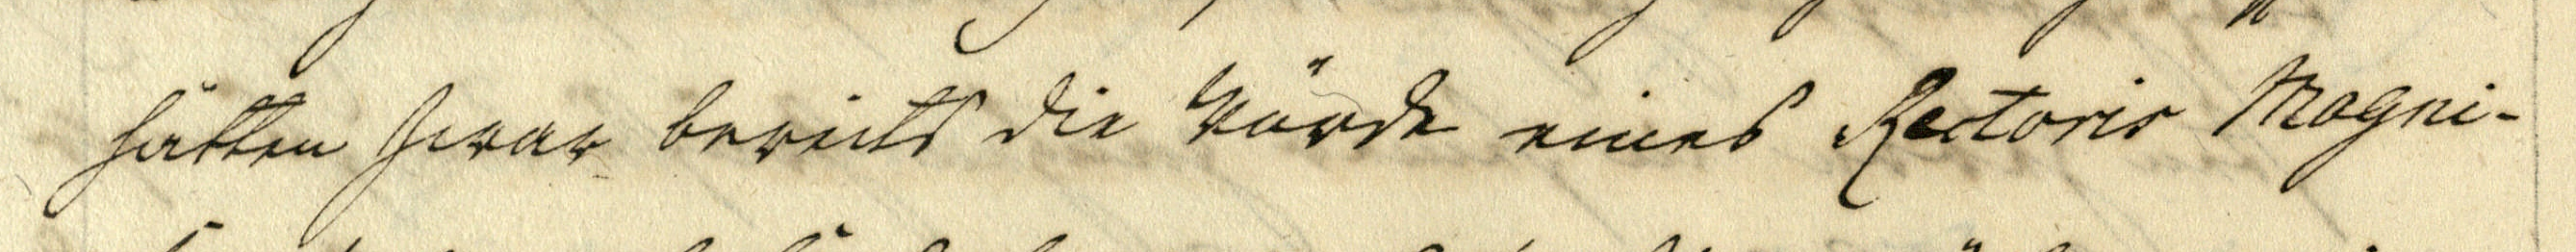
hätten zwar bereits die Würde eines Recotris Magni-
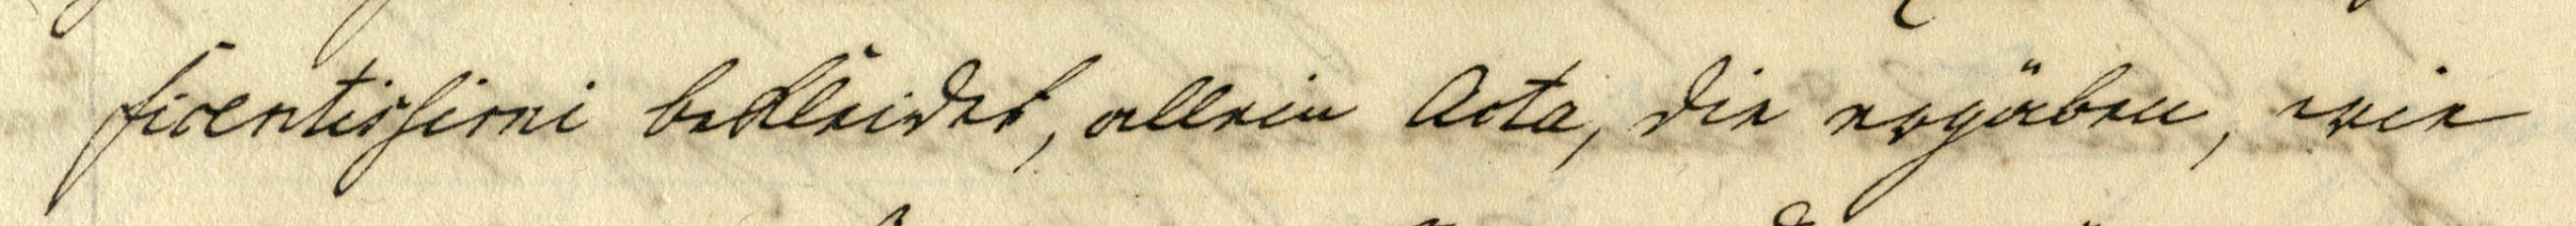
ficentissimi bekleidet, allein Acta, die ergäben, wie
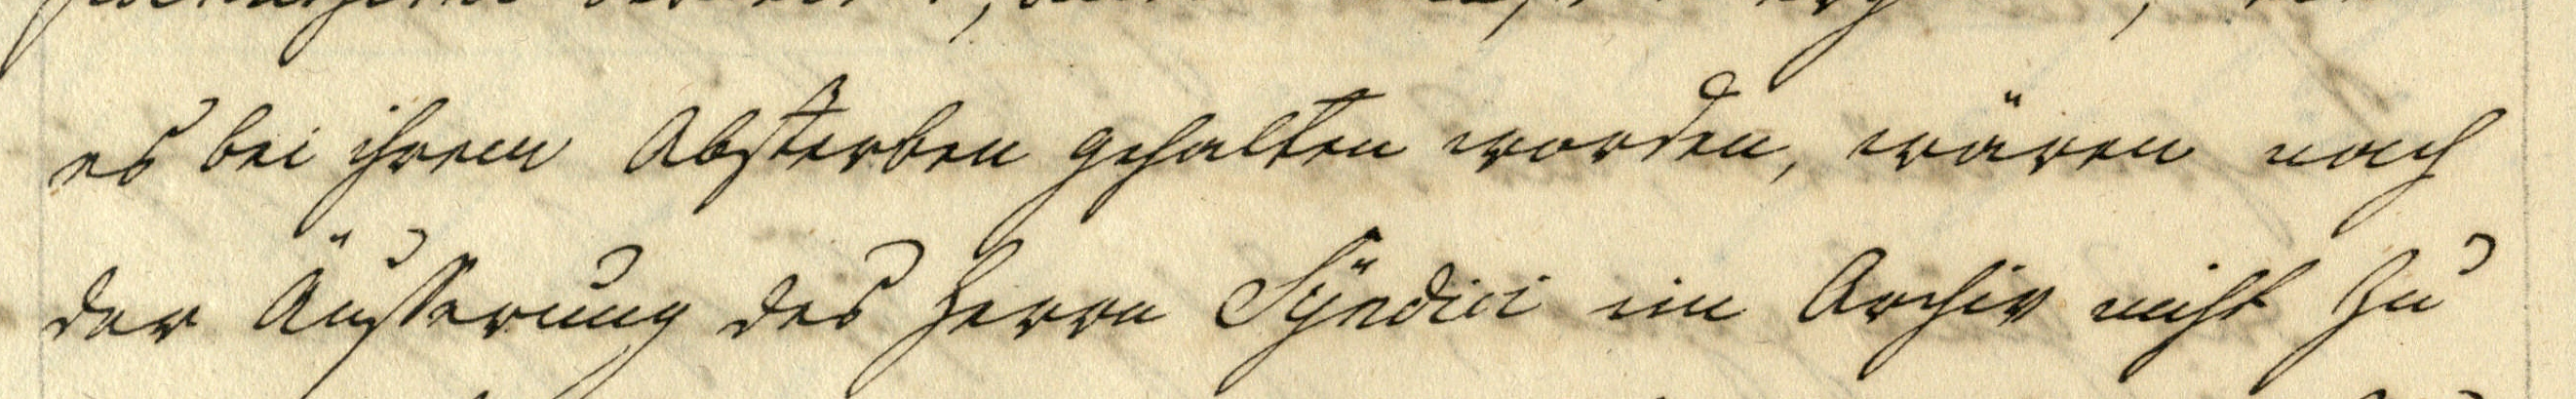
es bei ihrem Absterben gehalten worden, wären nach
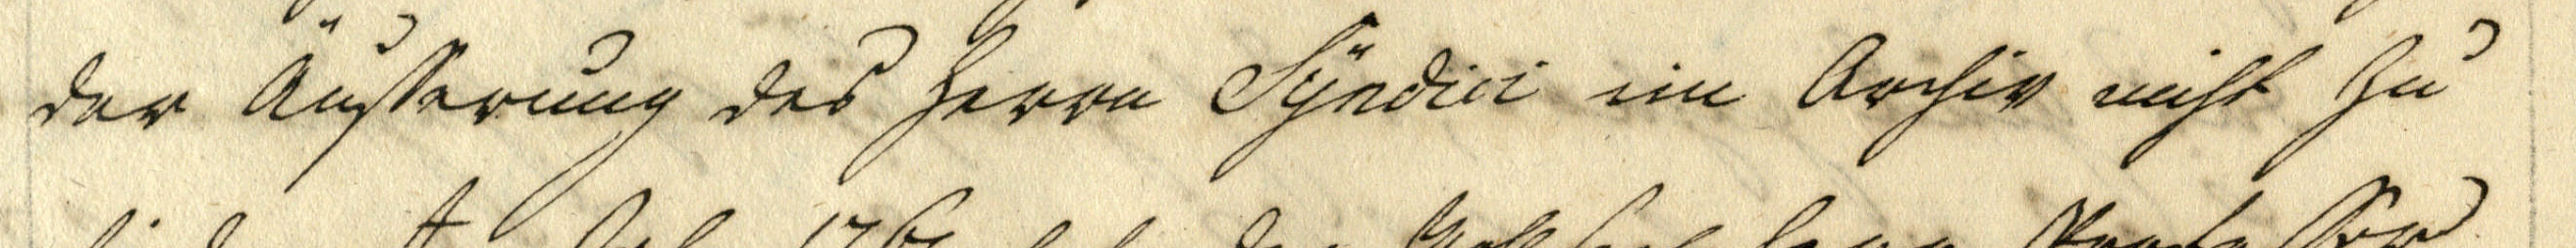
der Äusserung des Herrn Syndici im Archiv nicht zu
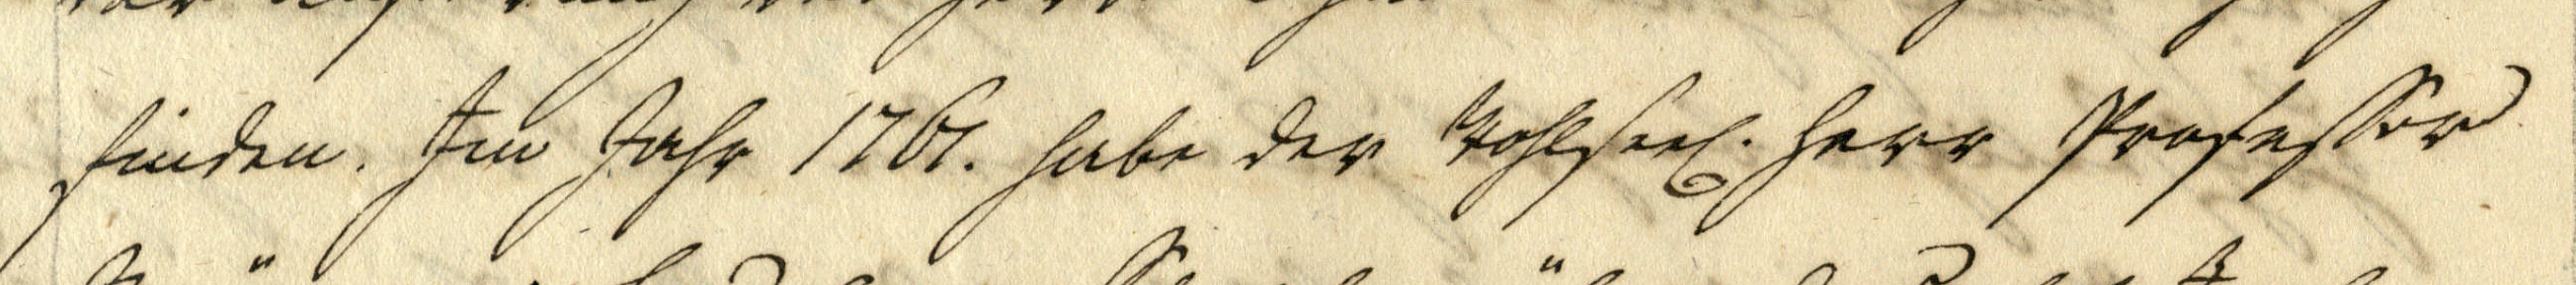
finden. Im Jahr 1767. habe der wohlseel. Herr Professor
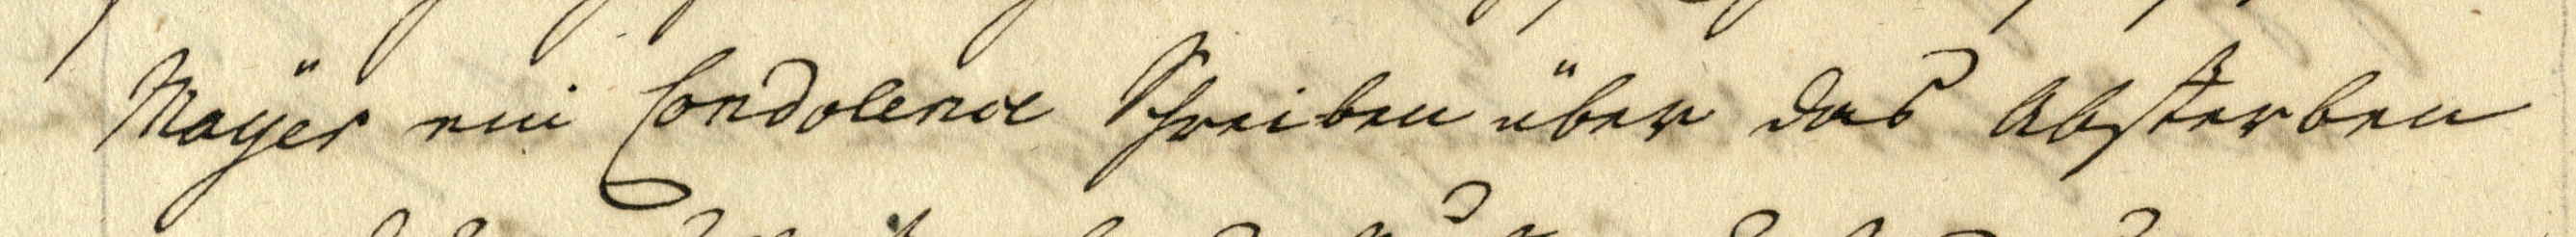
Mayer ein Condolence Schreiben über das Absterben
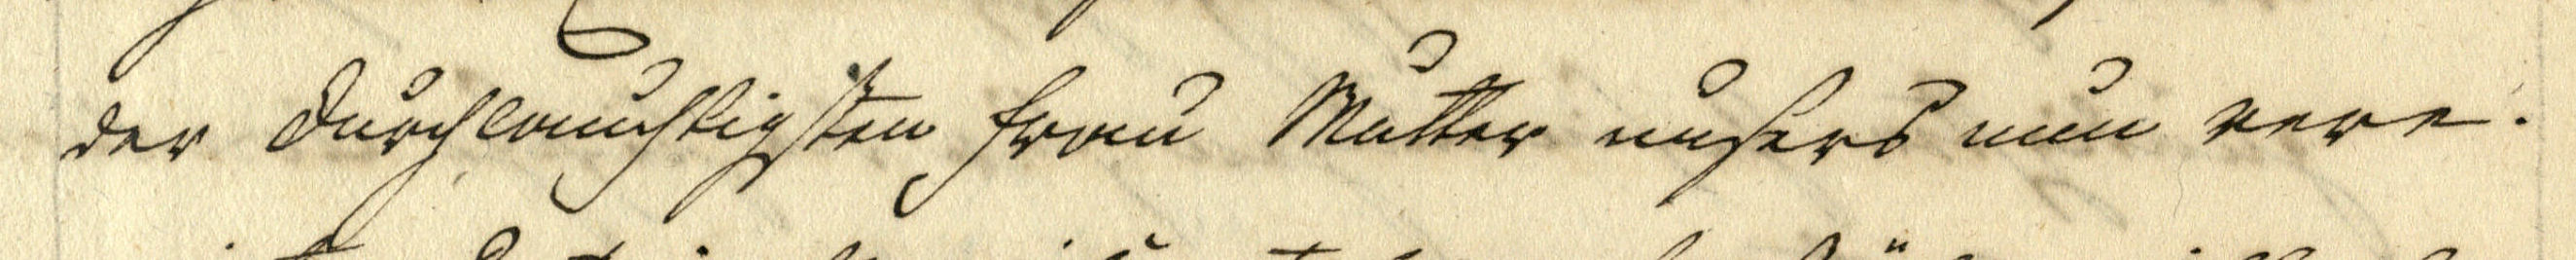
der durchlauchtigsten Frau Mutter unsers nun vere-
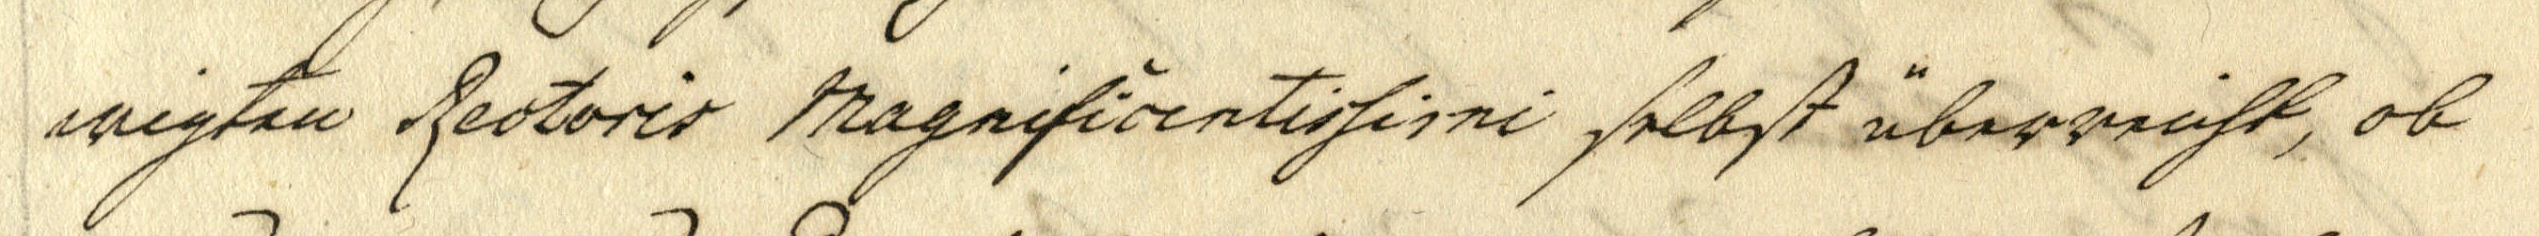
wigten Rectoris Magnificentissimi selbst überreicht, ob
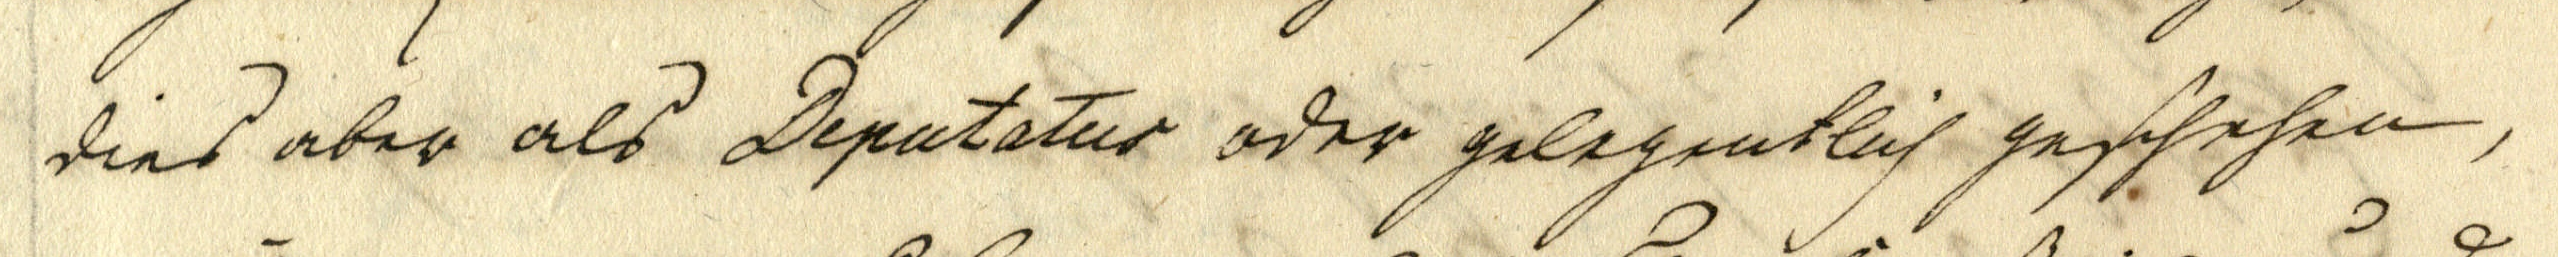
dies aber als Deputatus oder gelegentlich geschehen,
